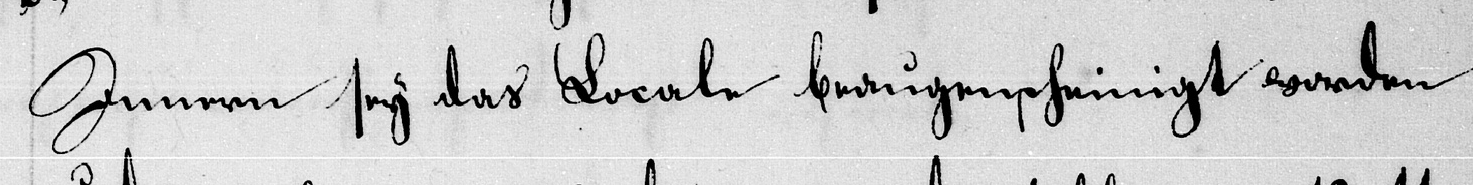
Innern sey das Locale beaugenscheinigt worden
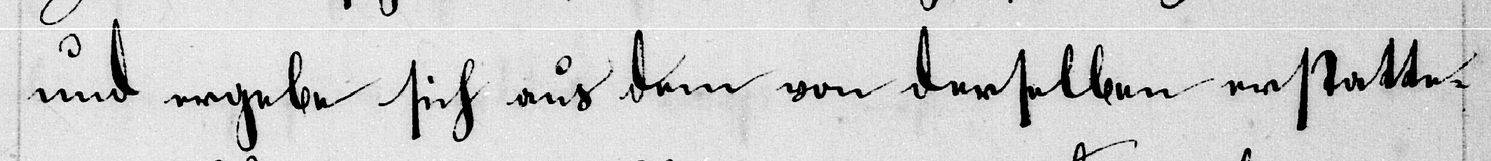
und ergebe sich aus dem von derselben erstatte¬
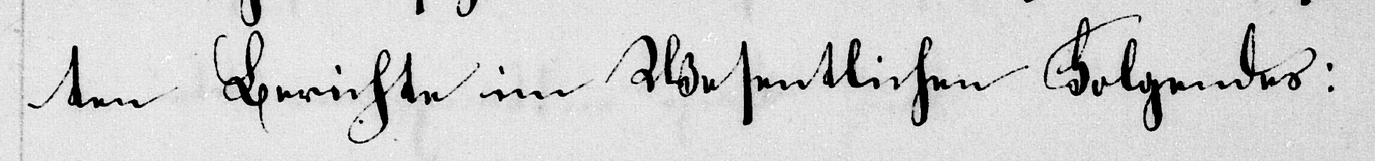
ten Berichte im Wesentlichen Folgendes:
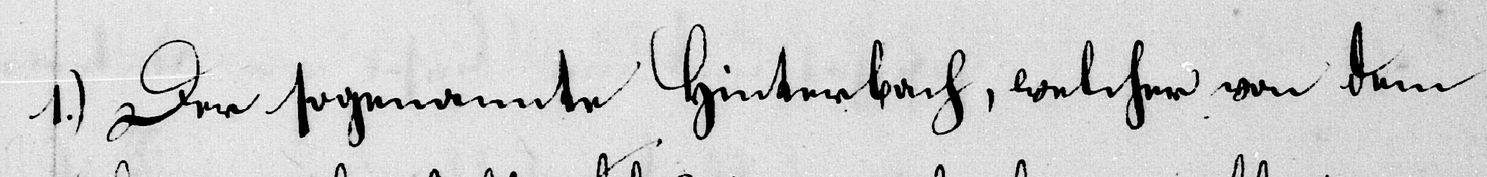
1.) Der sogenannte Hinterbach, welcher von dem
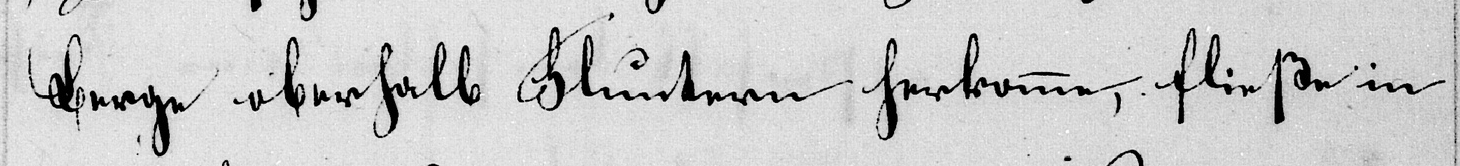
Berge oberhalb Fluntern herkomme, fließe in
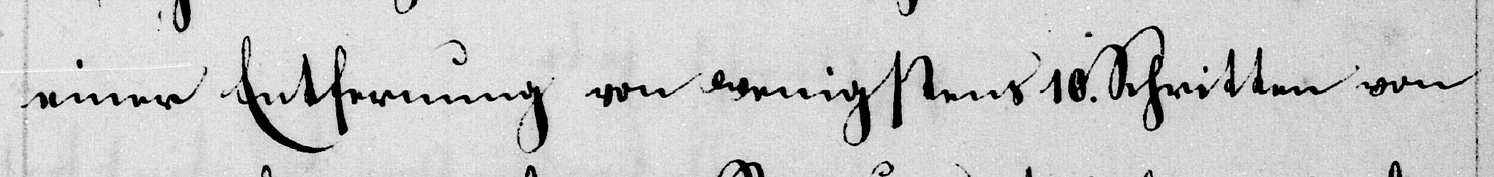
einer Entfernung von wenigstens 10. Schritten von
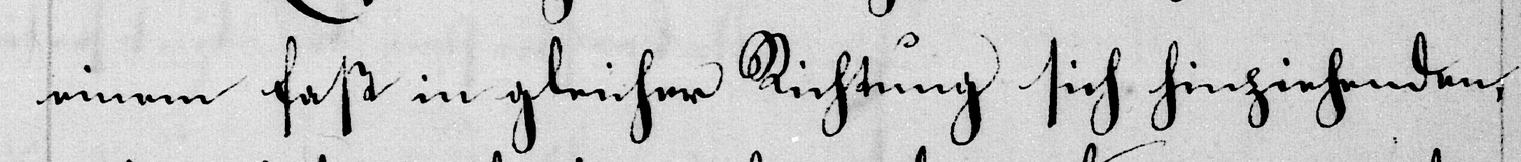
einem fast in gleicher Richtung sich hinziehenden,
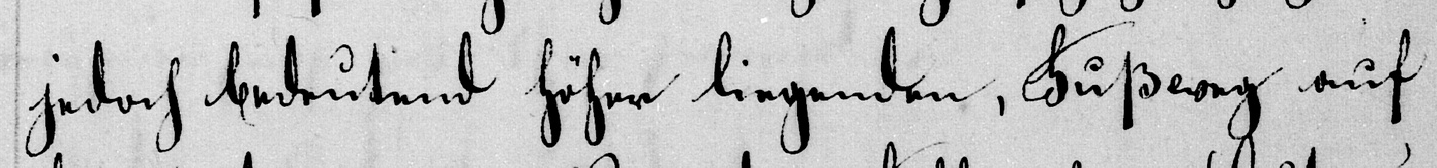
jedoch bedeutend höher liegenden, Fußweg auf
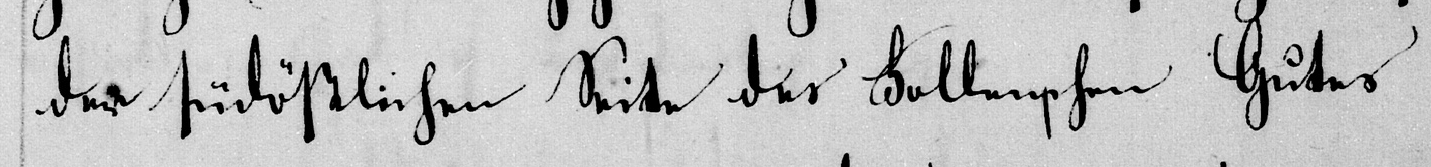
der südöstlichen Seite des Follenschen Gutes
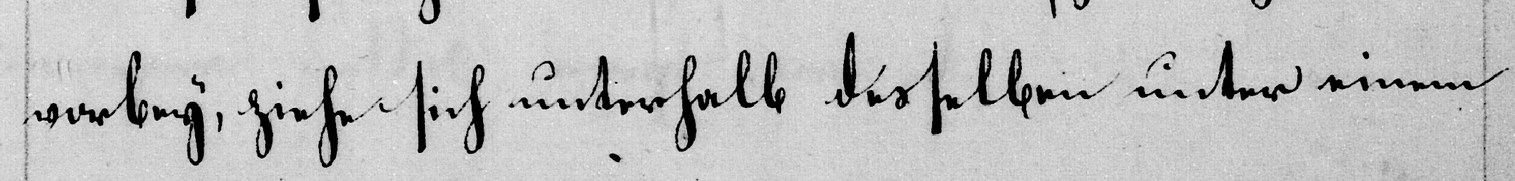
vorbey, ziehe sich unterhalb desselben unter einem
